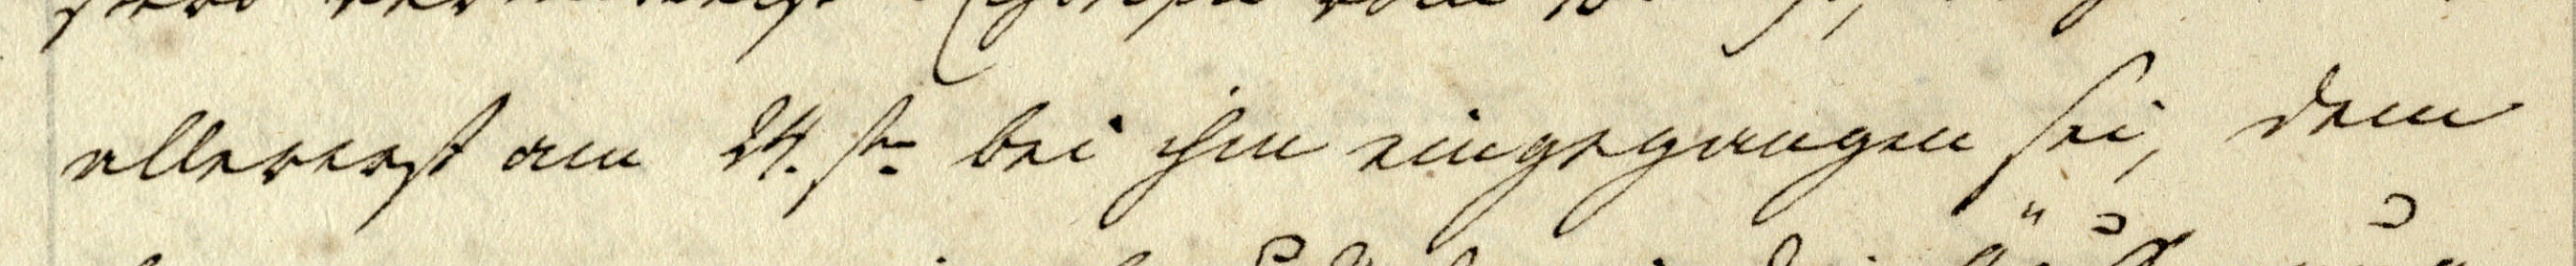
allererst am 24. sten bei ihm eingegangen sei, dem
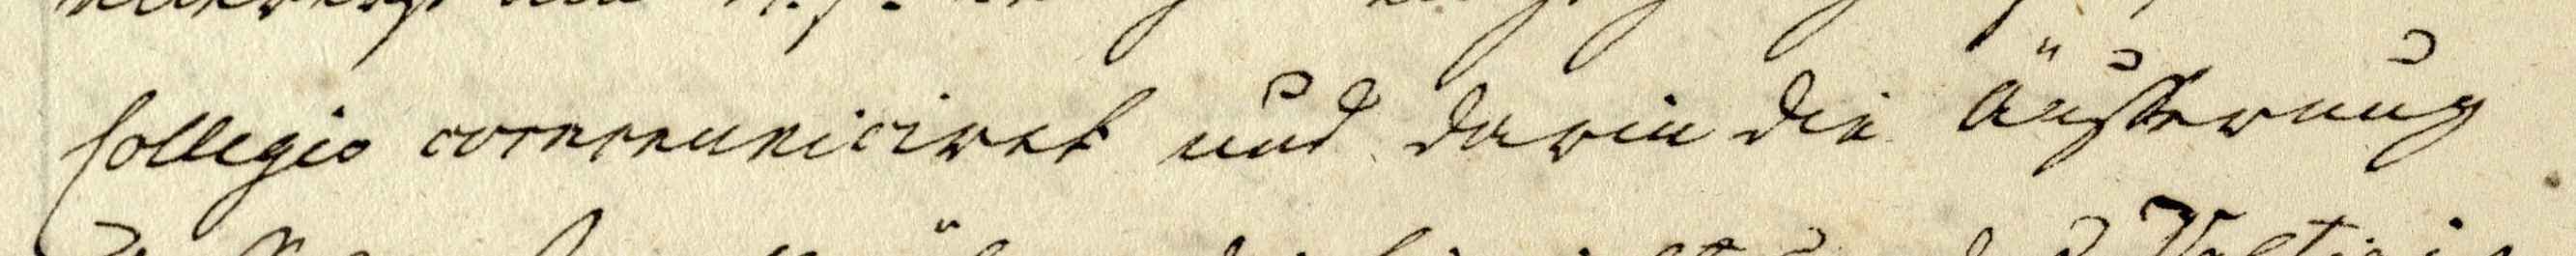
Collegio communiciret und darin die Äusserung
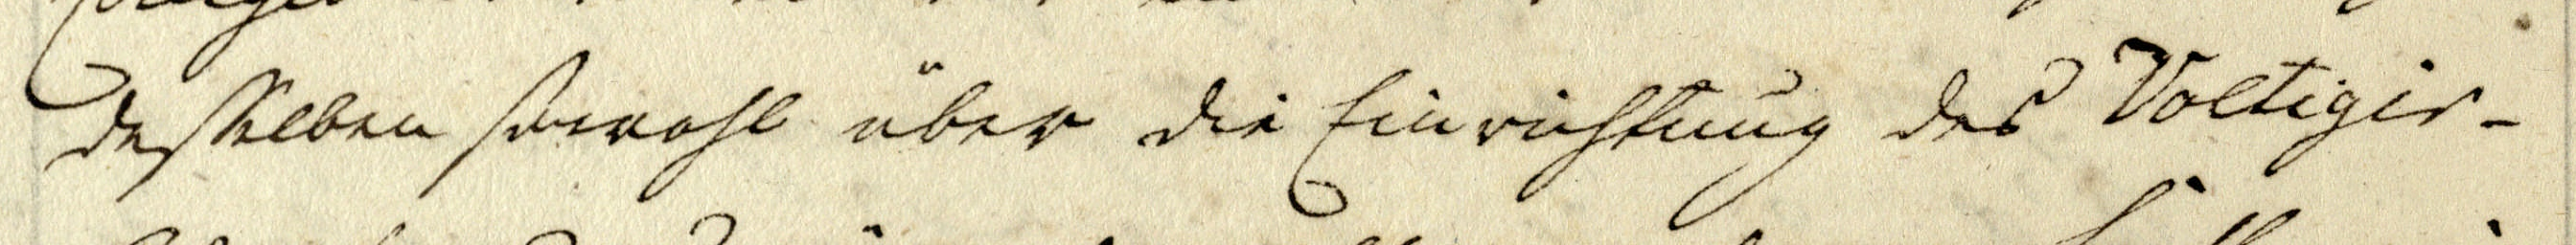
desselben sowohl über die Einrichtung des Voltigir¬
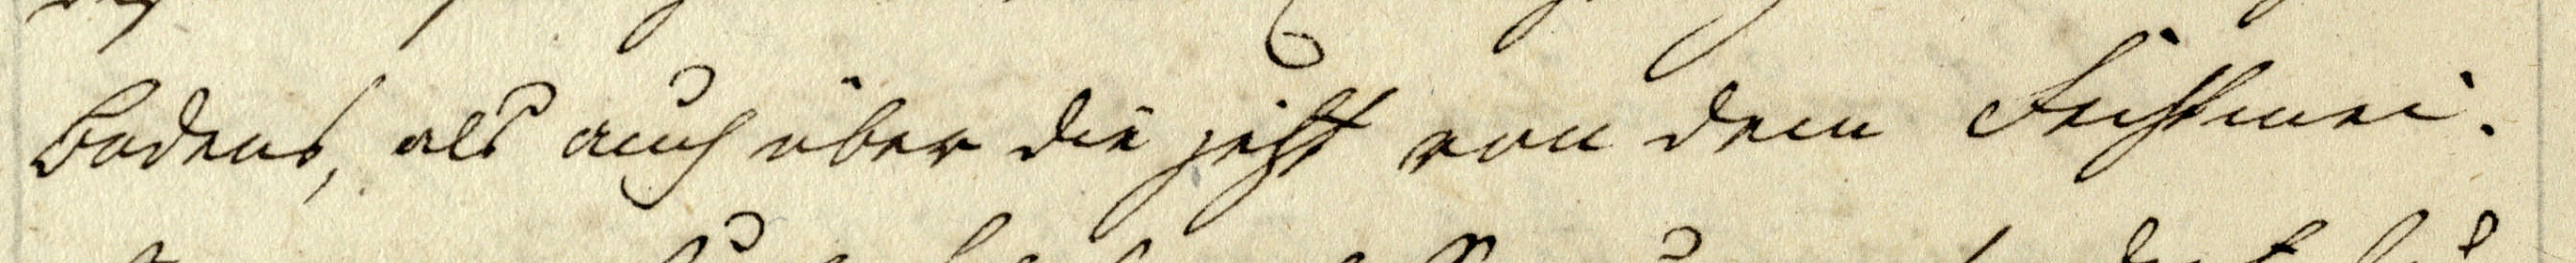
Bodens, als auch über die jetzt von dem Fechtmei¬
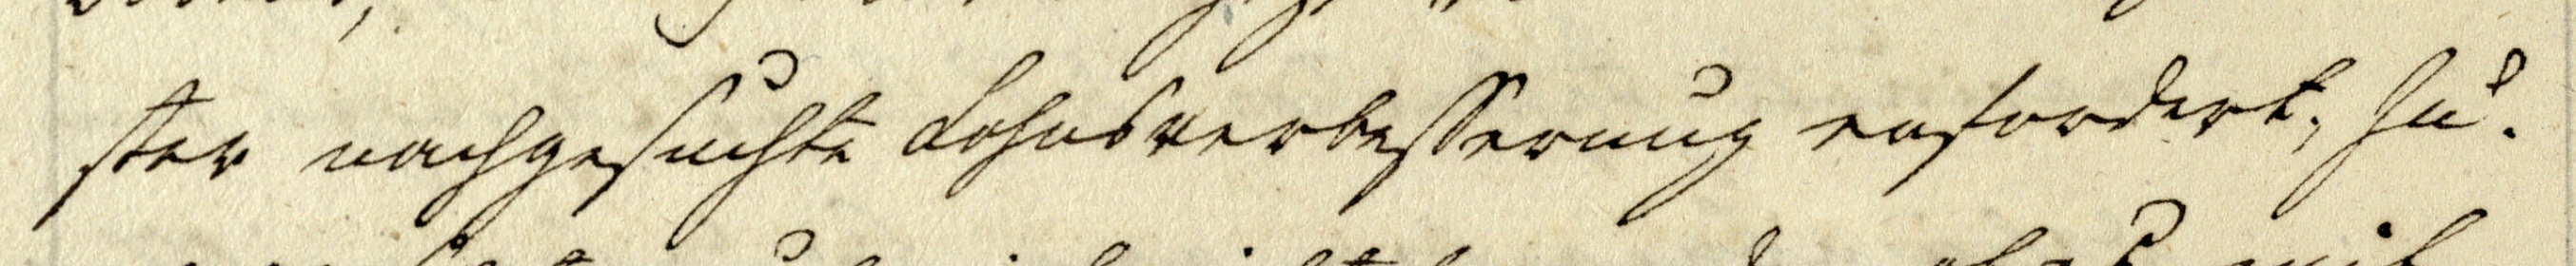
ster nachgesuchte Lohnsverbesserung erfordert, zu
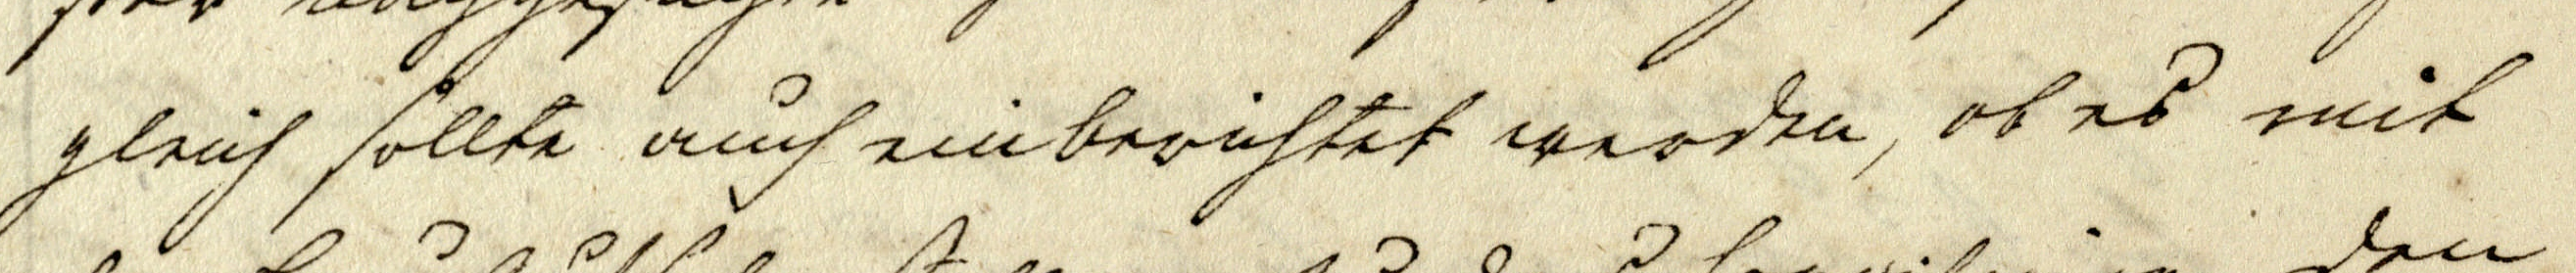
gleich sollte auch einberichtet werden, ob es mit
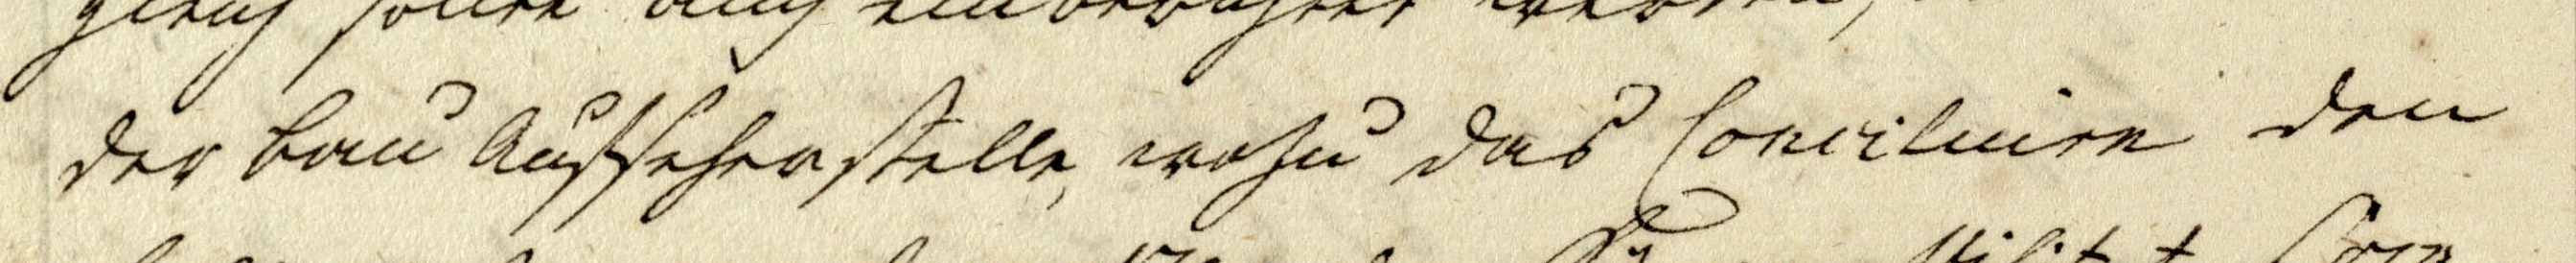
der Bau Aufseherstelle, wozu das Concilium den
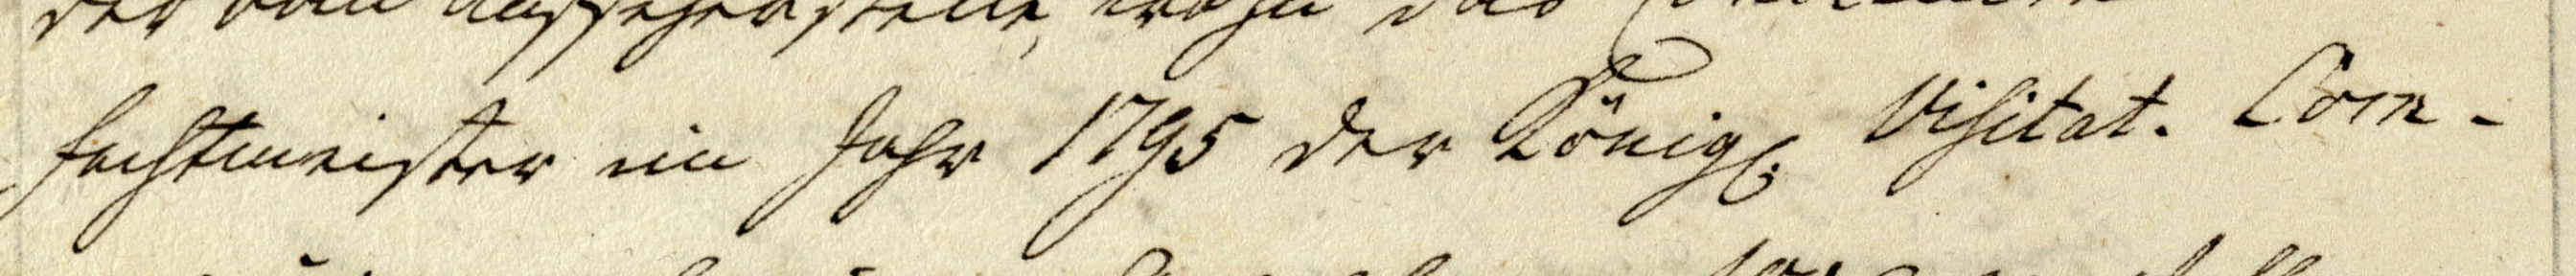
Fechtmeister im Jahr 1795 der Königl. Visitat. Com¬
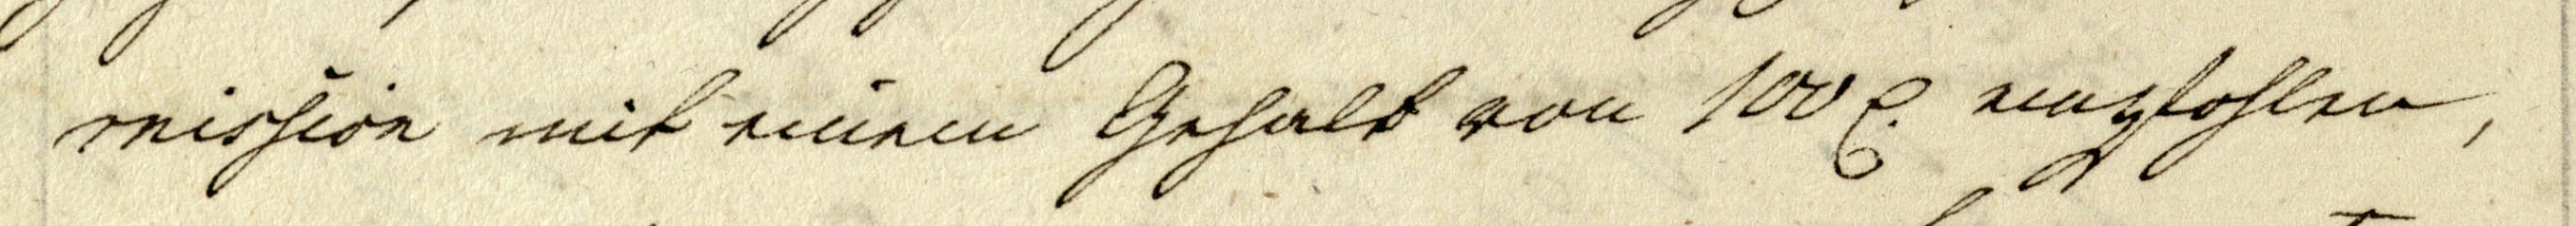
mission mit einem Gehalt von 100 l. empfohlen,
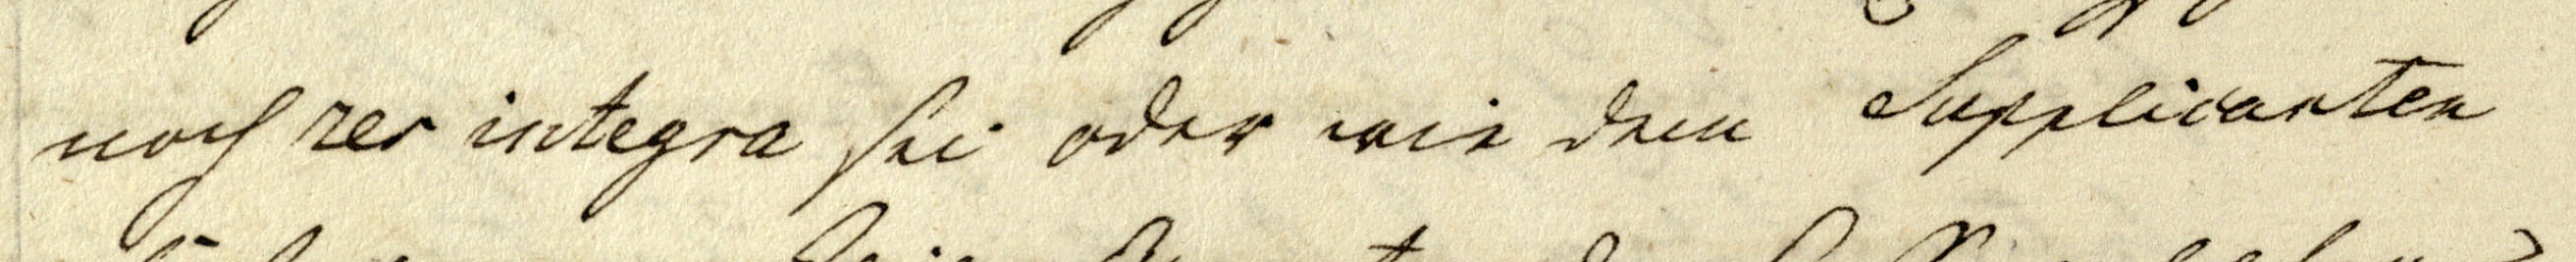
noch res integra sei oder wie dem Supplicanten
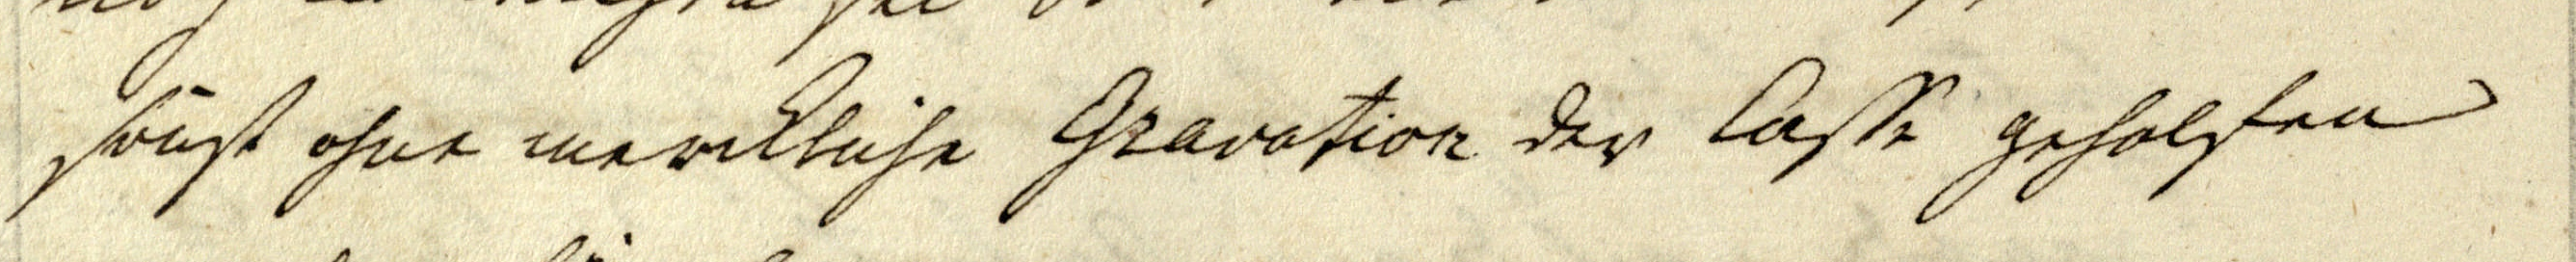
sonst ohne merckliche Gravation der Casse geholfen
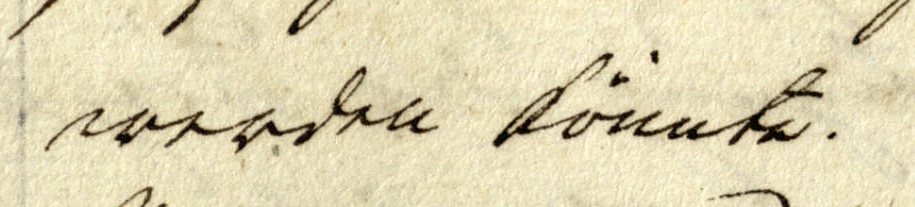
werden könnte.
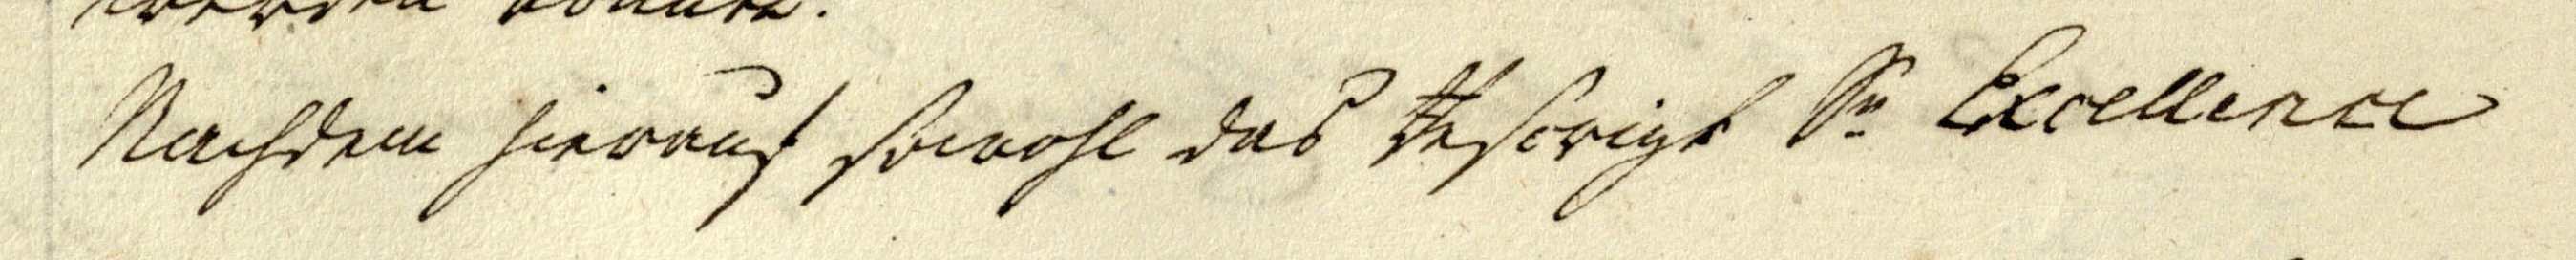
Nachdem hierauf sowohl das Rescript Sr Excellence
